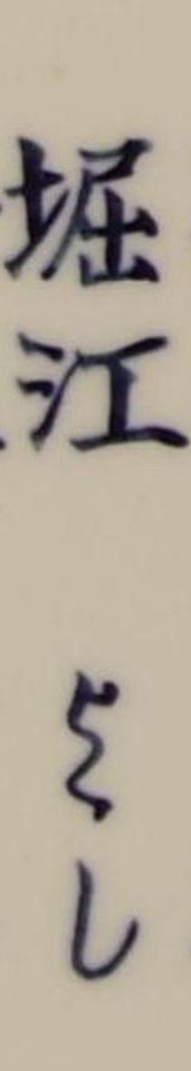堀江よし
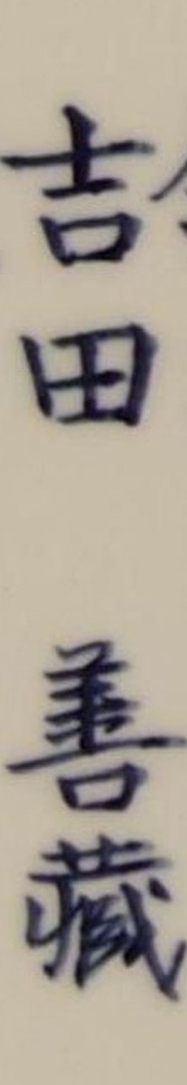吉田善蔵
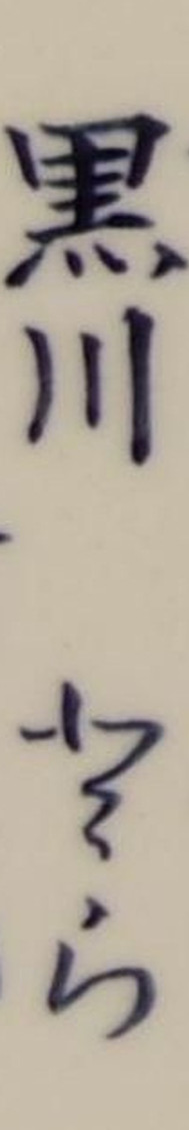黒川とら
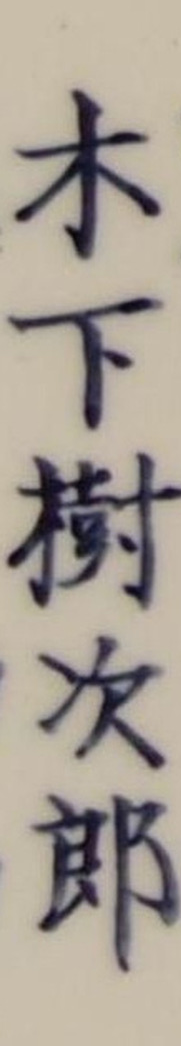木下樹次郎
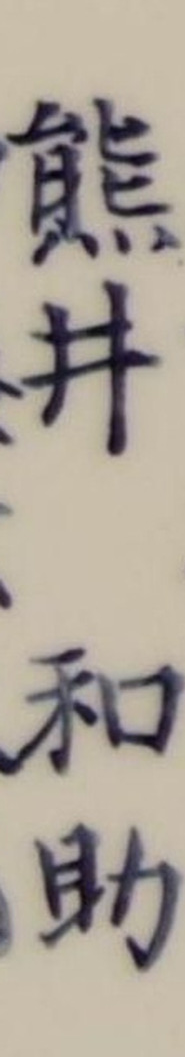熊井和助
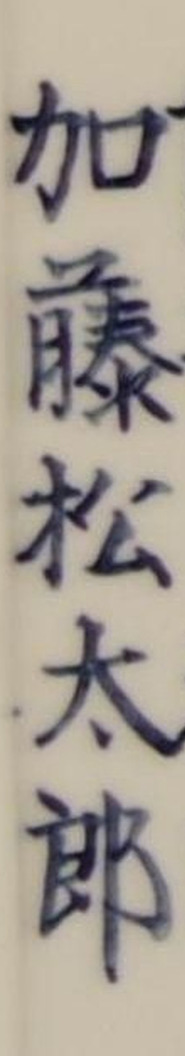加藤松太郎

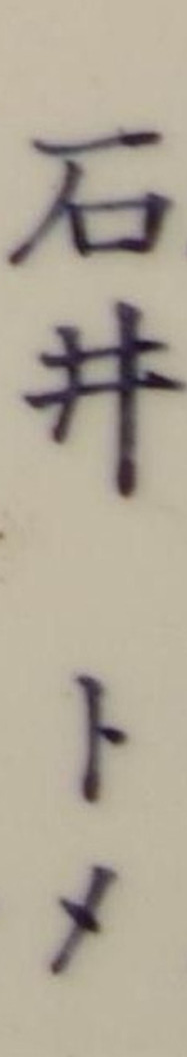石井トメ
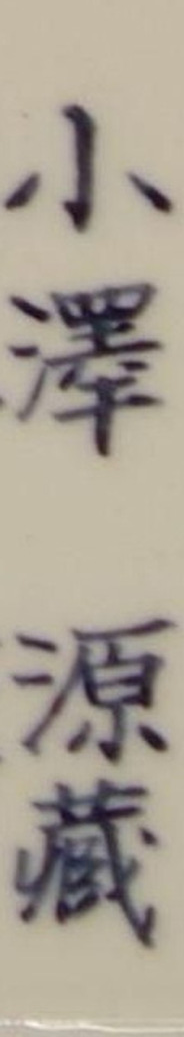小澤源蔵
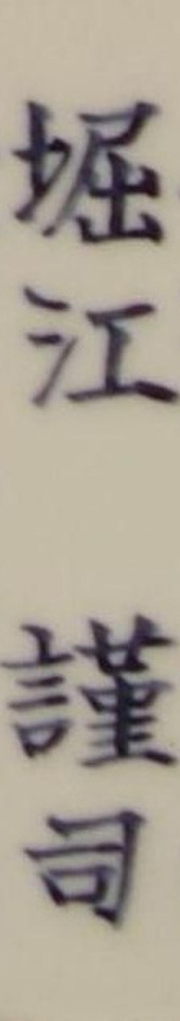堀江謹司
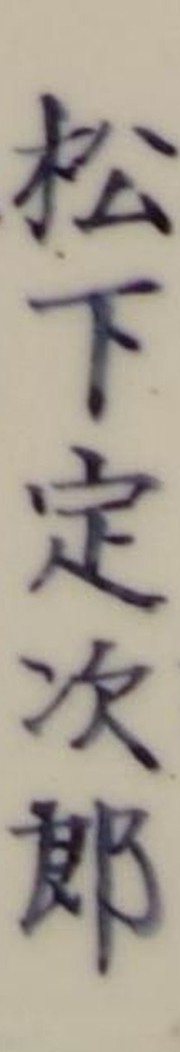松下定次郎
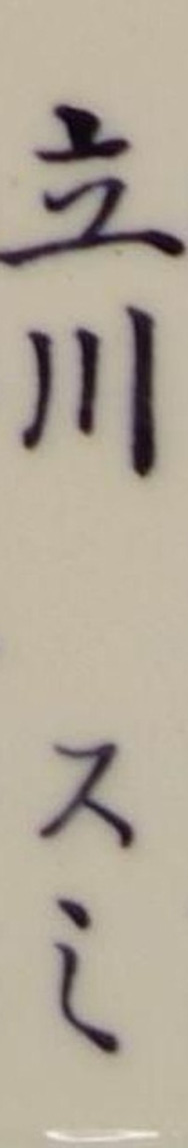立川スミ
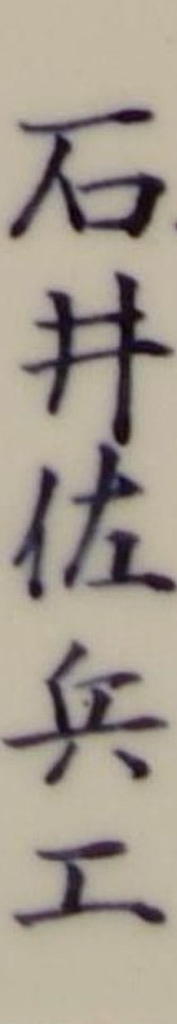石井佐兵衛
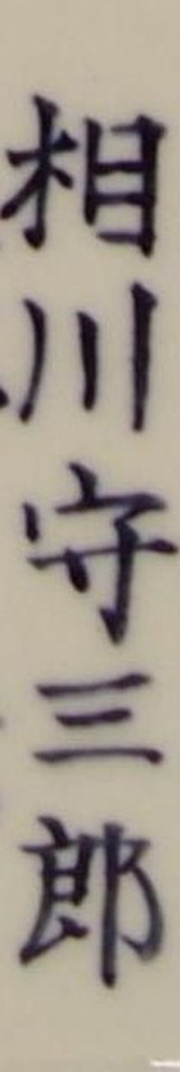相川守三郎
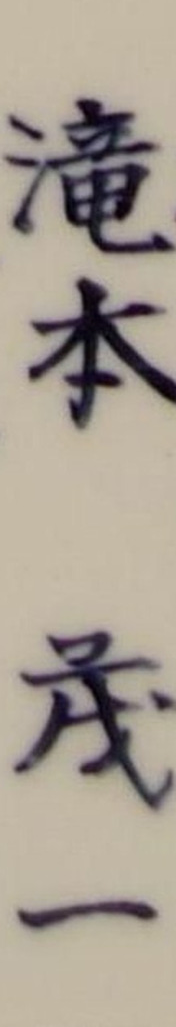滝本茂一
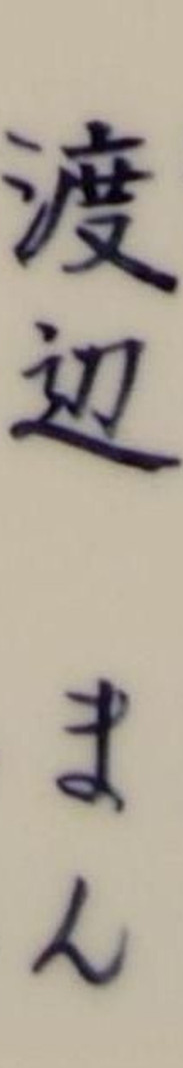渡辺まん
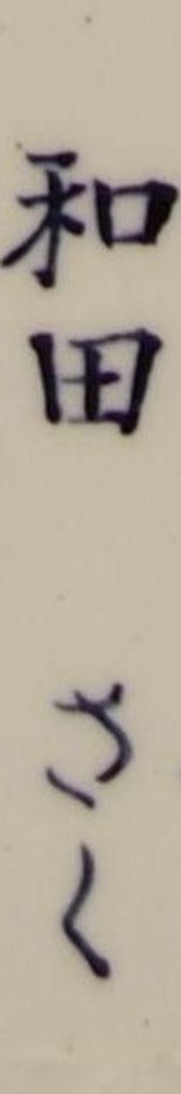和田さく
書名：E~L
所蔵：高野山金剛峯寺
